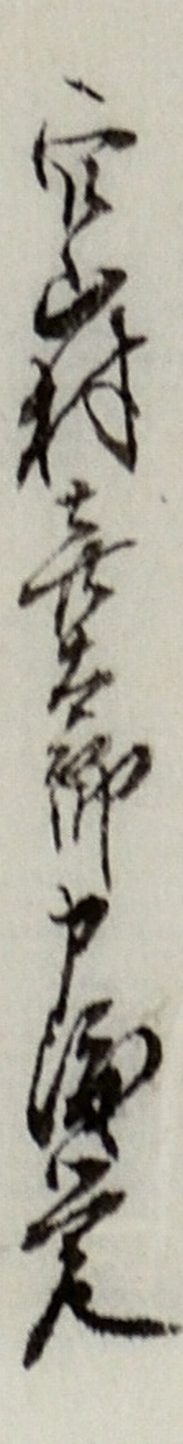穴山村喜太郎申渡覚
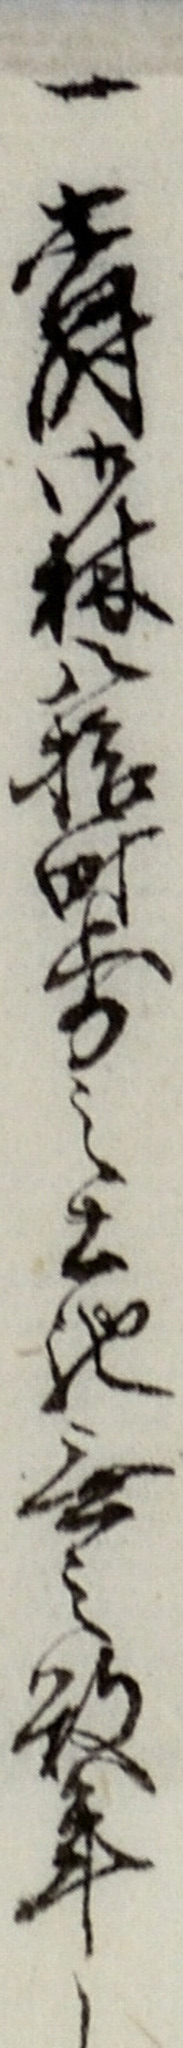一当時御林八拾町歩之土馳無之数年
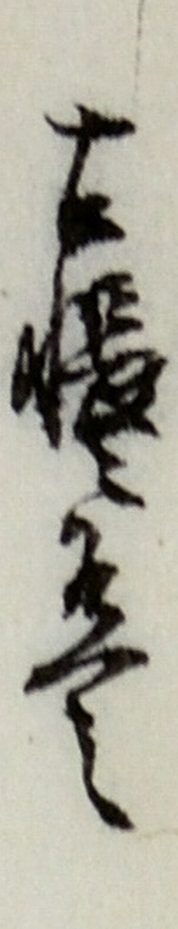古帳ニ有之

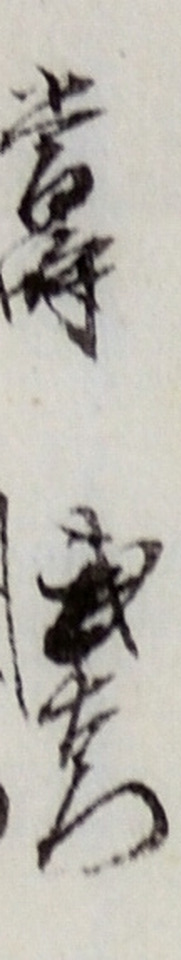当時小右衛門
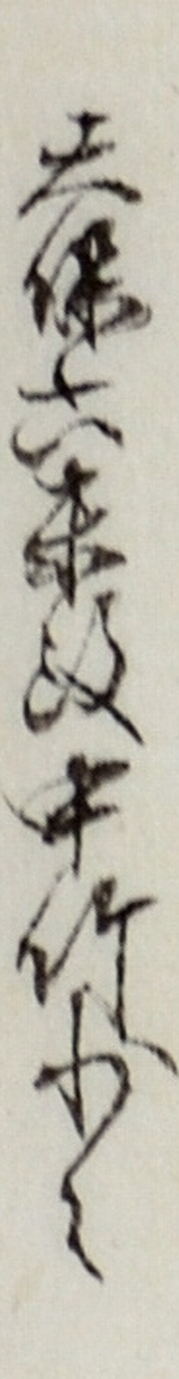天保六未改中竹少々
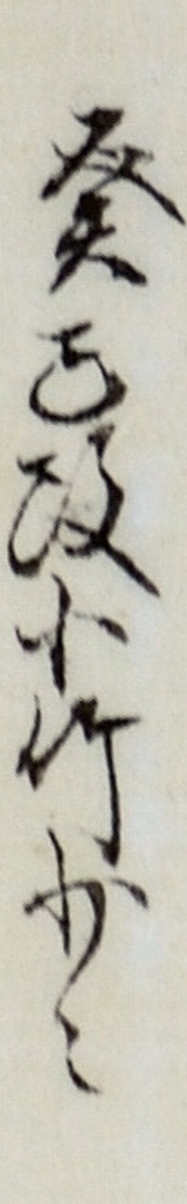癸巳改小竹少々

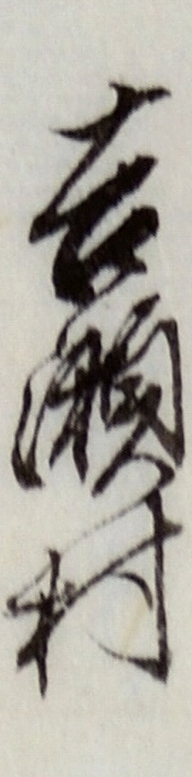吉瀬村
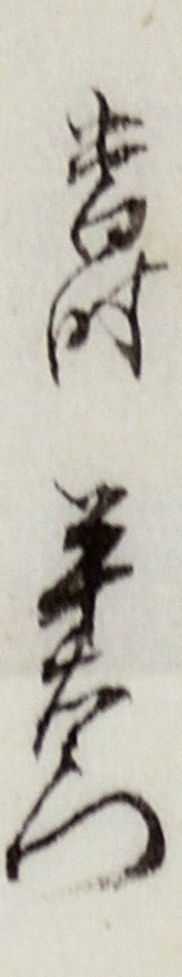当時半右衛門
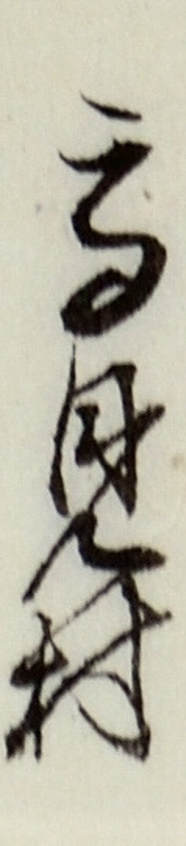高見村

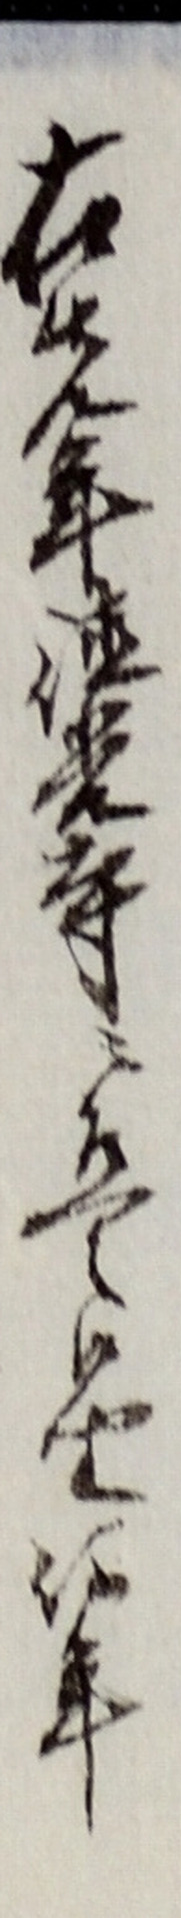右先年徳光寺ニ有之候由何年
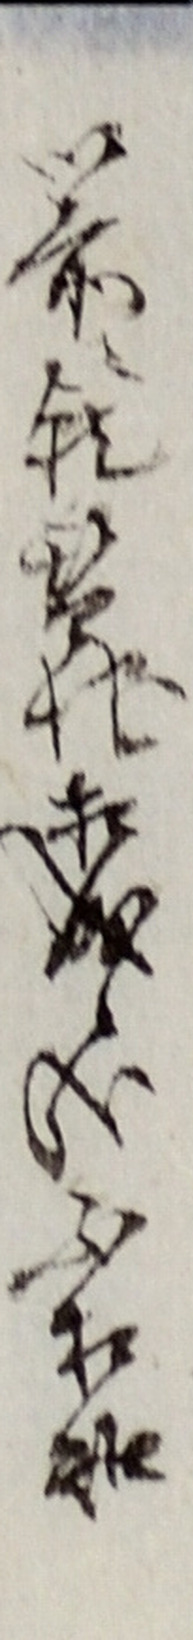以前ニ欤替地相成候哉不相知
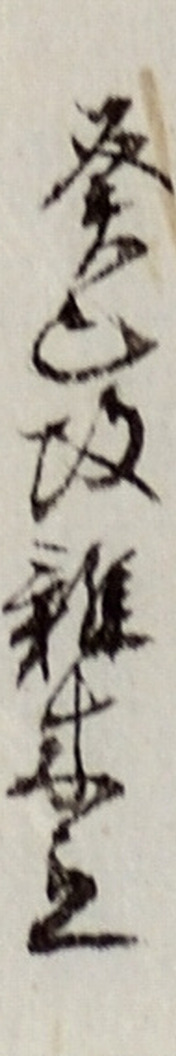癸巳改雑木立
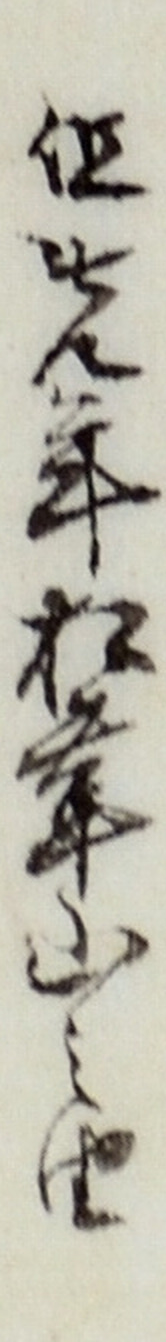但先年松茸山之由

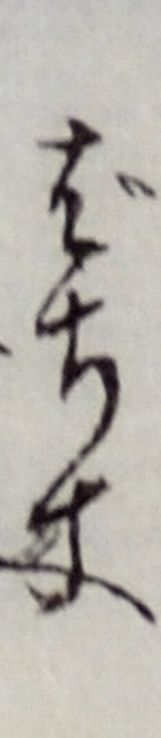ばち木
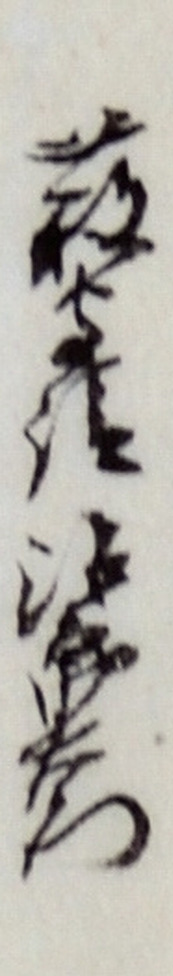藪守請治郎右衛門
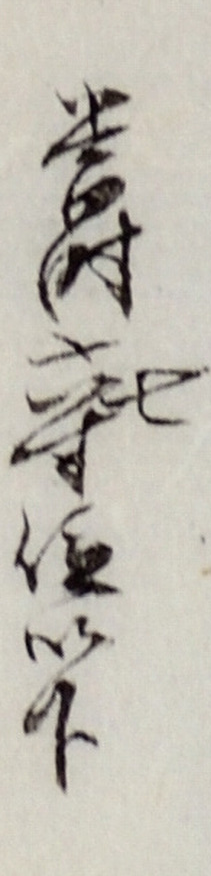当時六七寸位以下
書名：山林帳草稿
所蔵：伊那市立高遠町図書館・合同会社AMANE
